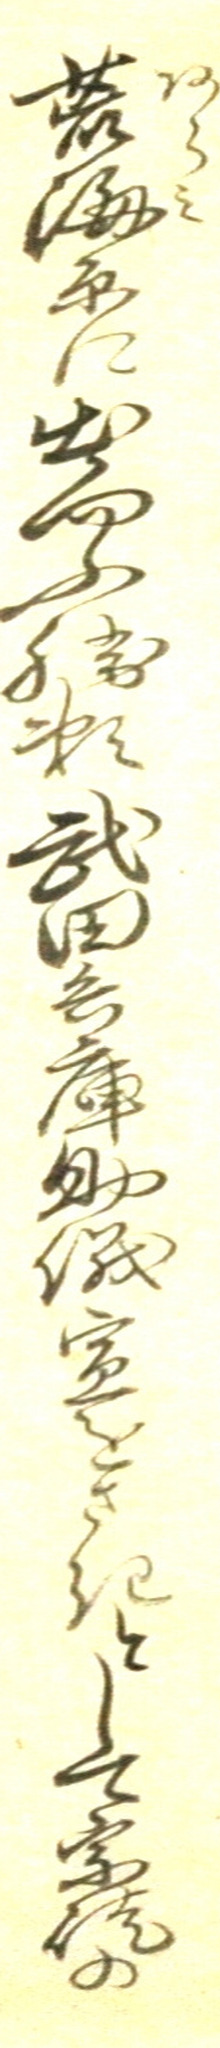荒海原に出向ふ勝頼武田兵庫助儀宣をさきとして宗徒の
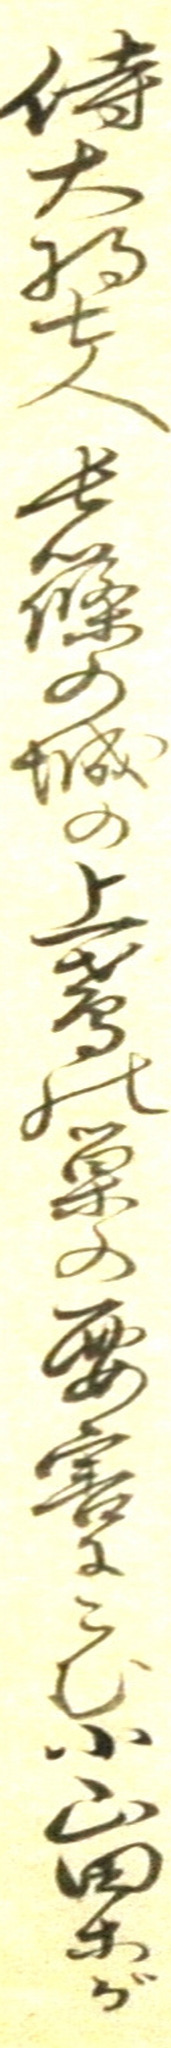侍大将七人長篠の城の上鳶の巣の要害にこむ小山田等が
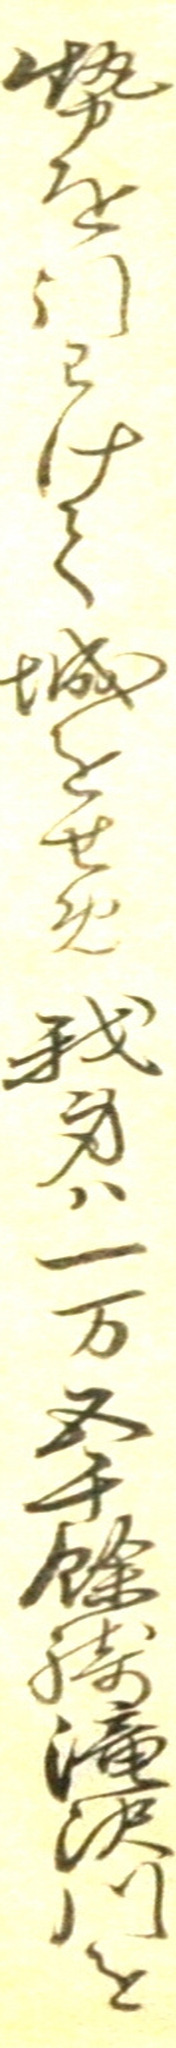勢を引わけて城をせめ我身は一万五千余騎滝沢川を
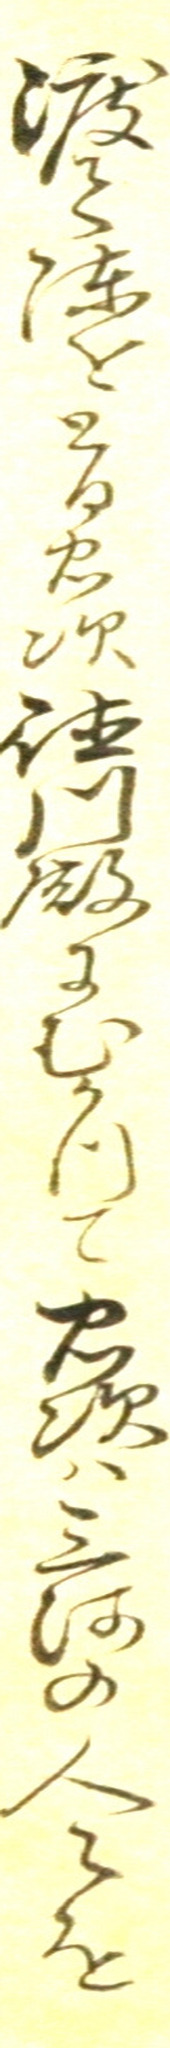渡て陣をとる忠次徳川殿にむかつて忠次は三河の人々を

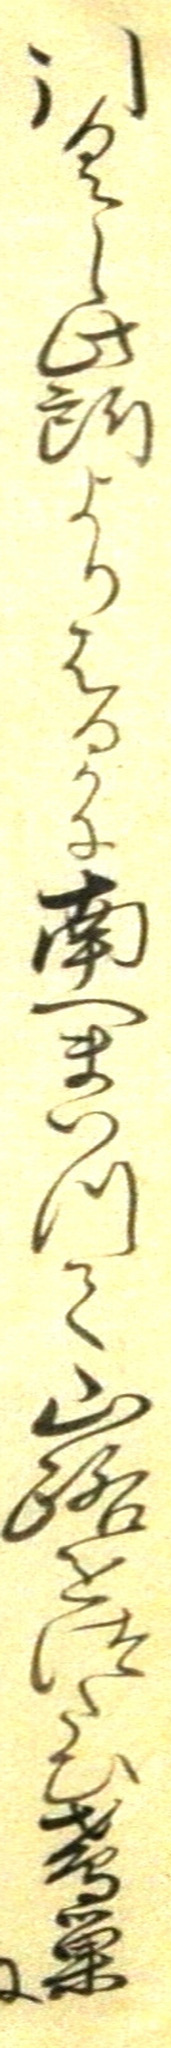引具し此所よりはるかに南へまいつて山路をつたひ鳶巣に
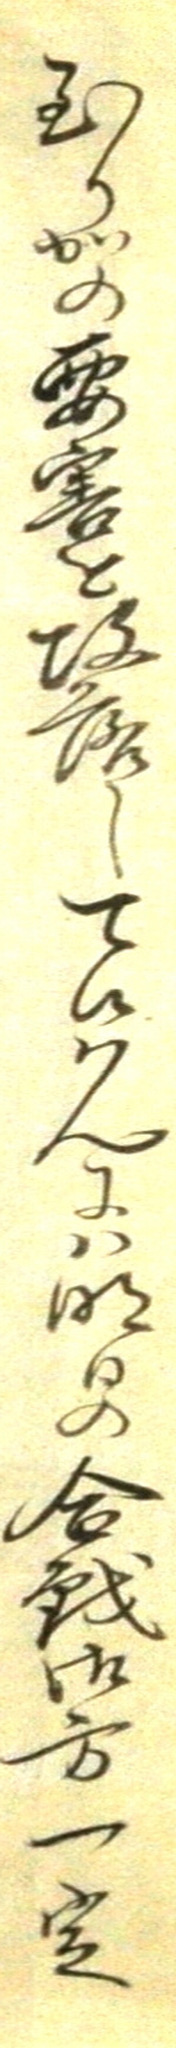至りかの要害を攻落して候はんには明日の合戦御方一定
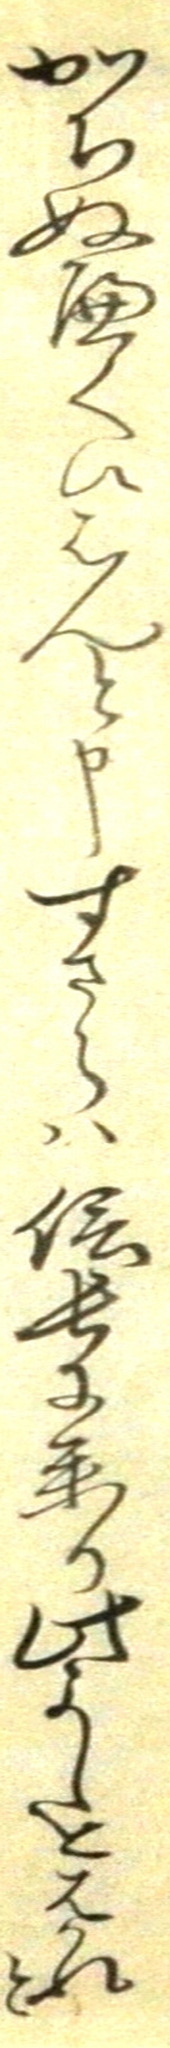かちぬへく候はんと申すさらは信長に参り此よしをはかれと
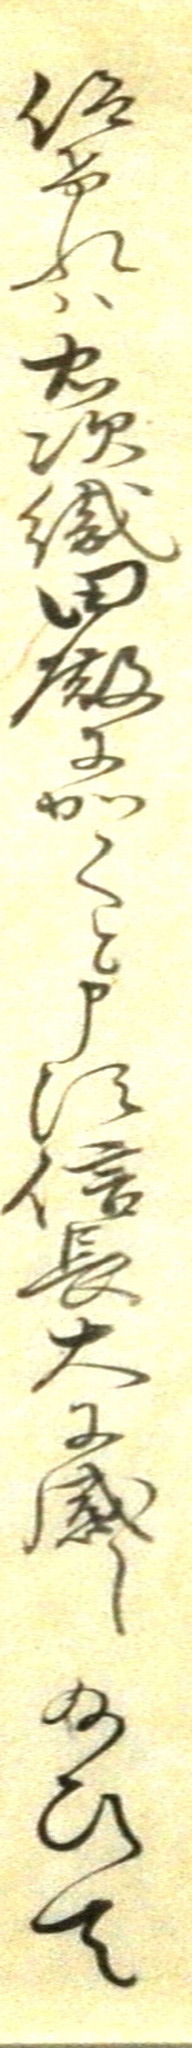仰けれは忠次織田殿にかくと申す信長大に感し給ひて
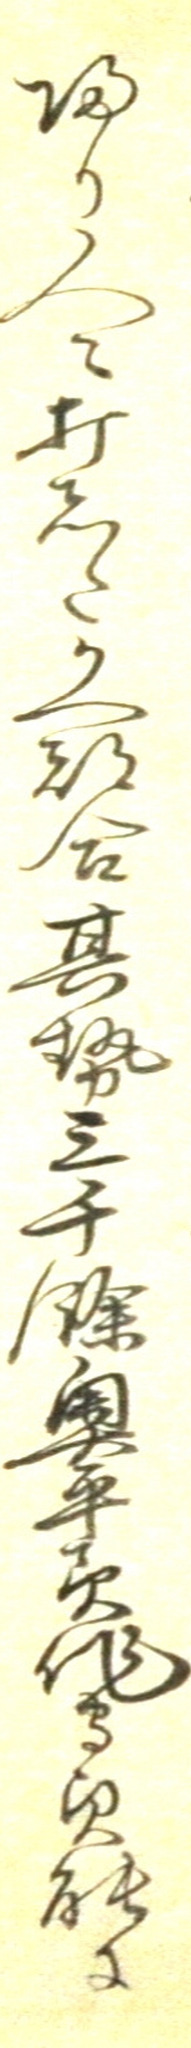帰り人々打したかへ都合其勢三千余奥平美作守貞能に
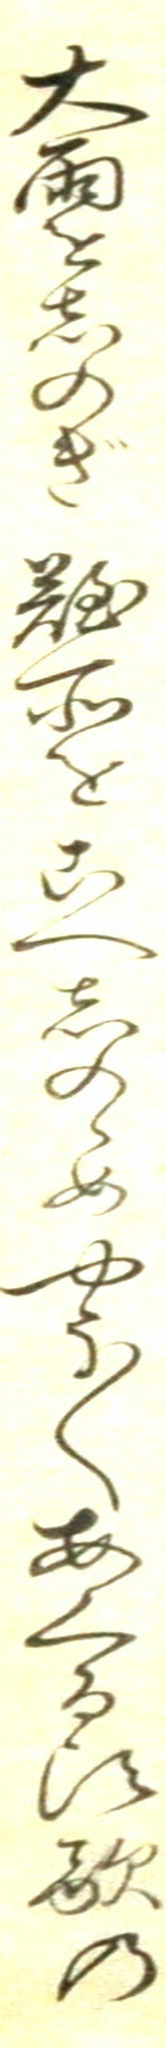大雨をしのぎ難所をこへしのゝめやう〳〵あくる頃敵の
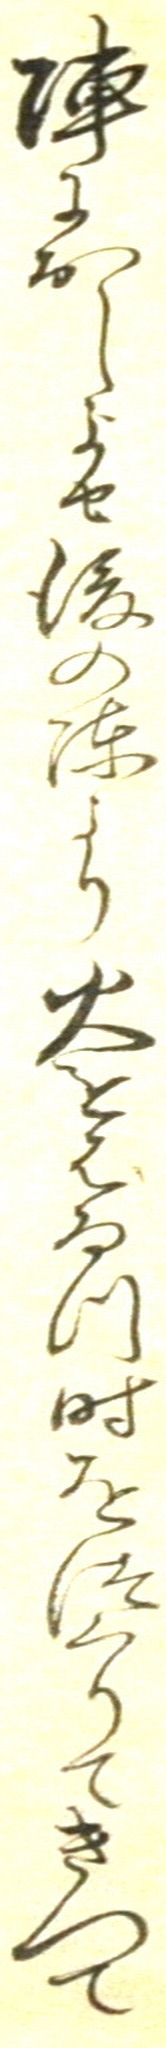陣におしよせ後の陣より火をはなつ時をつくりてきつて
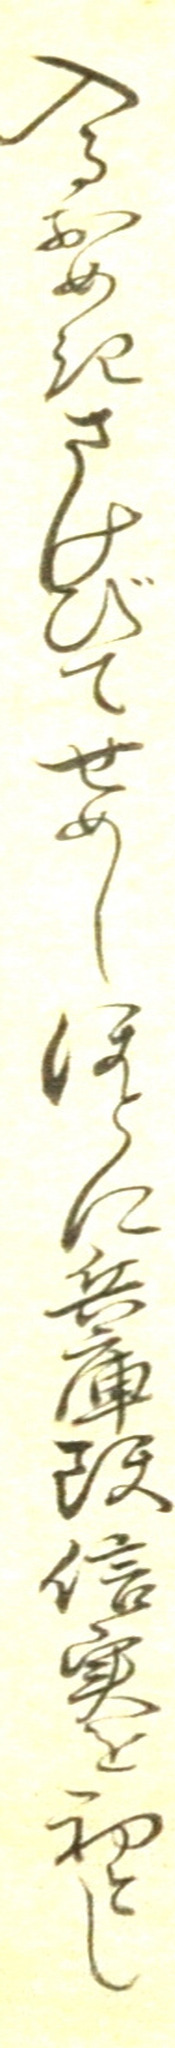入るおめきさけびてせめしほとに兵庫頭信実を初とし
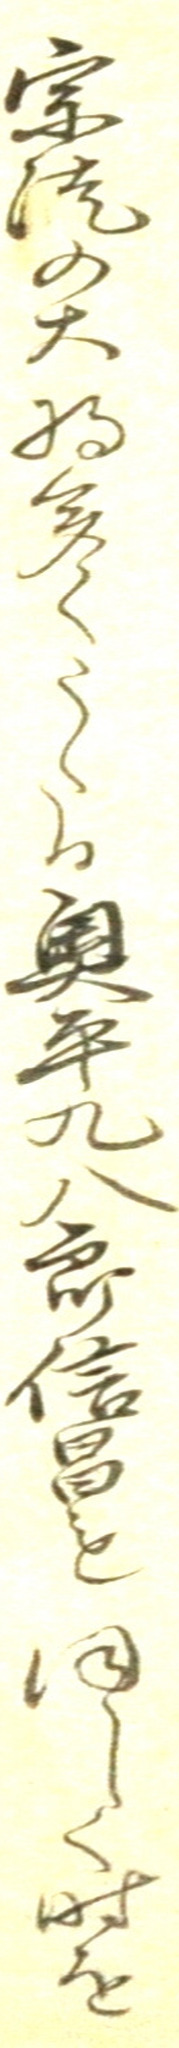宗との大将多くうたる奥平九八郎信昌も同しく時を
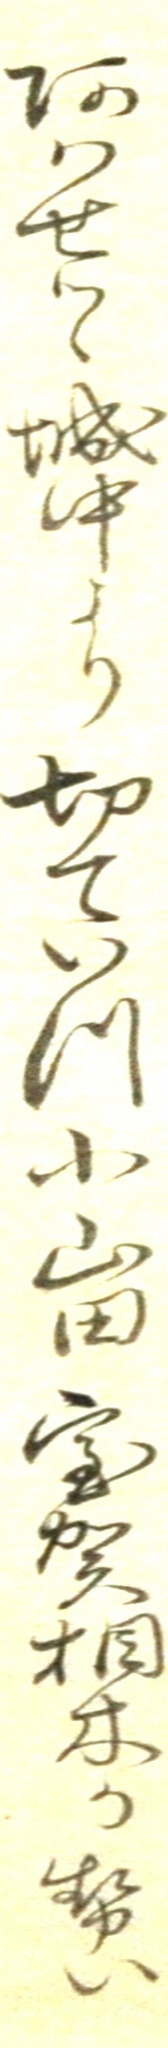あはせツヽ城中より切ていつ小山田室賀相木か勢い
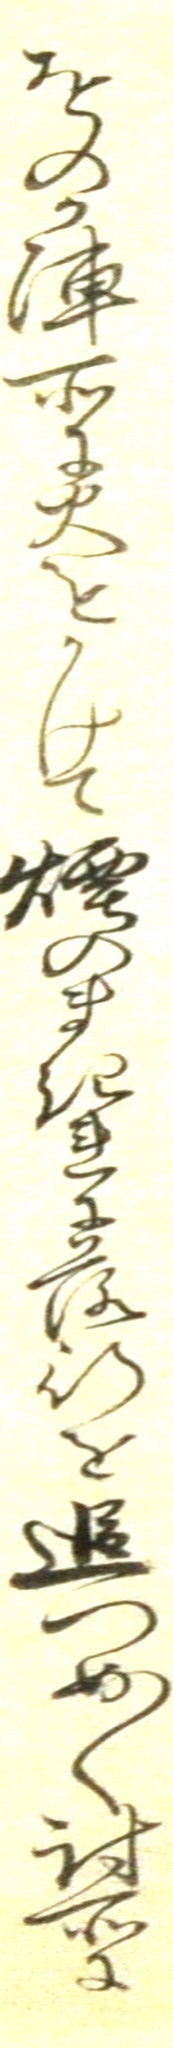をのか陣所に火をかけて煙のまきれに落行を追つめ〳〵討所に
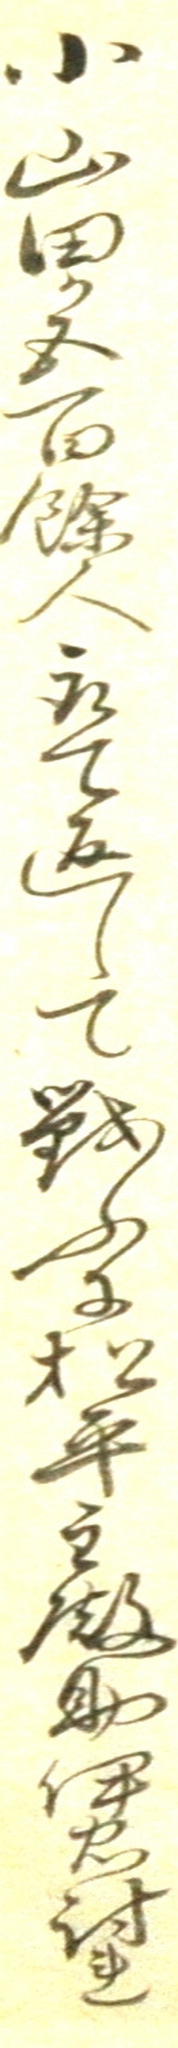小山田か五百余人取て返して戦ふに松平主殿助伊忠討れ
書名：藩翰譜（四・上）
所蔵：伊那市立高遠町図書館・合同会社AMANE
